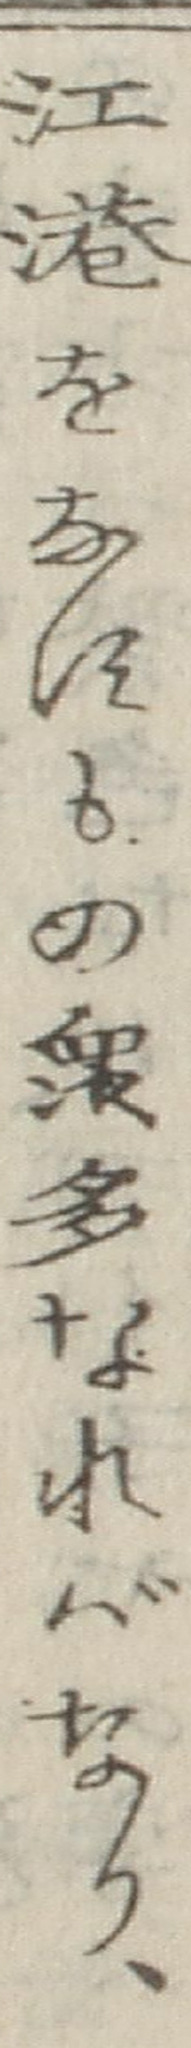江港をなすもの衆多なればなり、
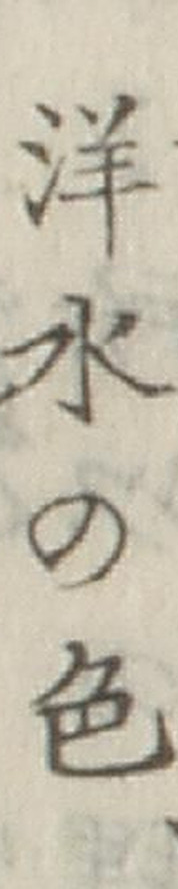洋水の色、
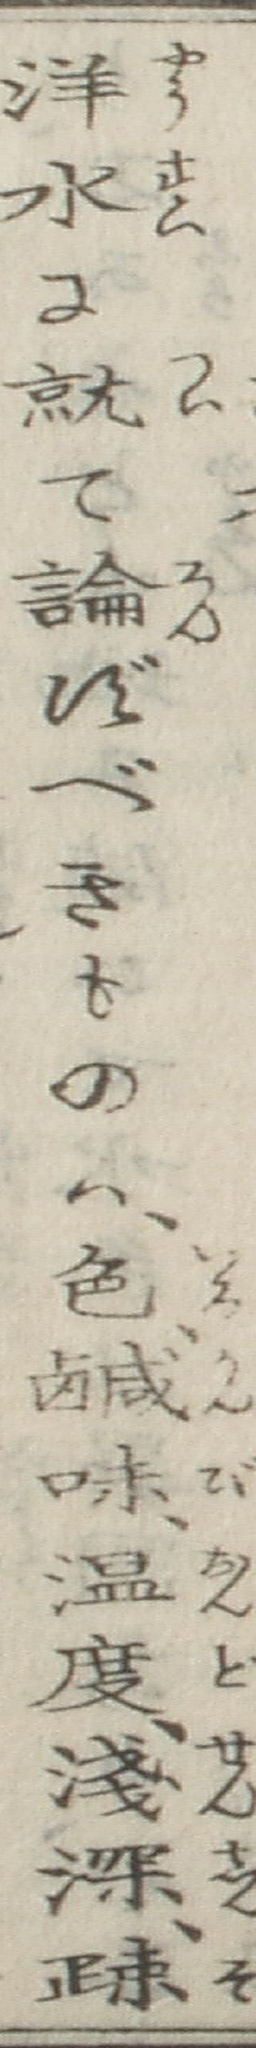洋水に就て論ずべきものは、色、鹹味、温度、浅深、疎
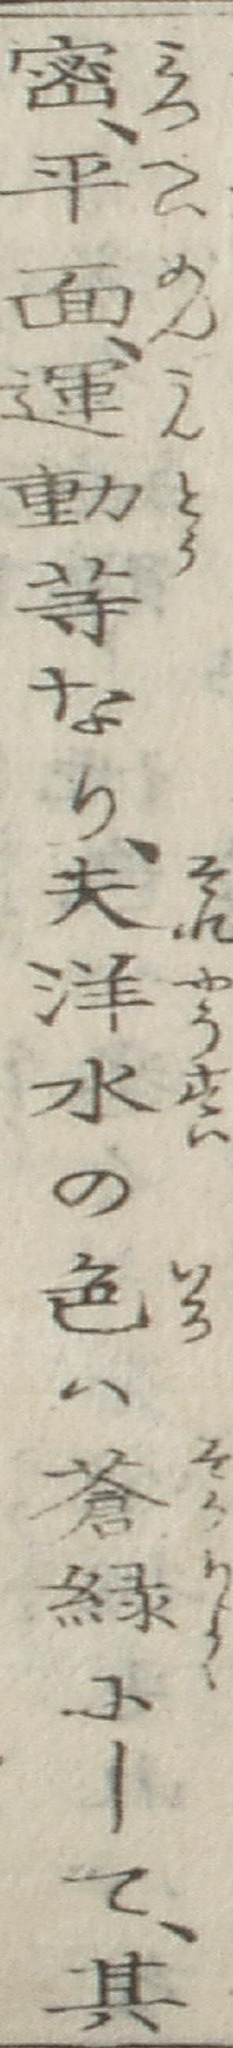密、平面、運動等なり、夫洋水の色は蒼緑にして、其
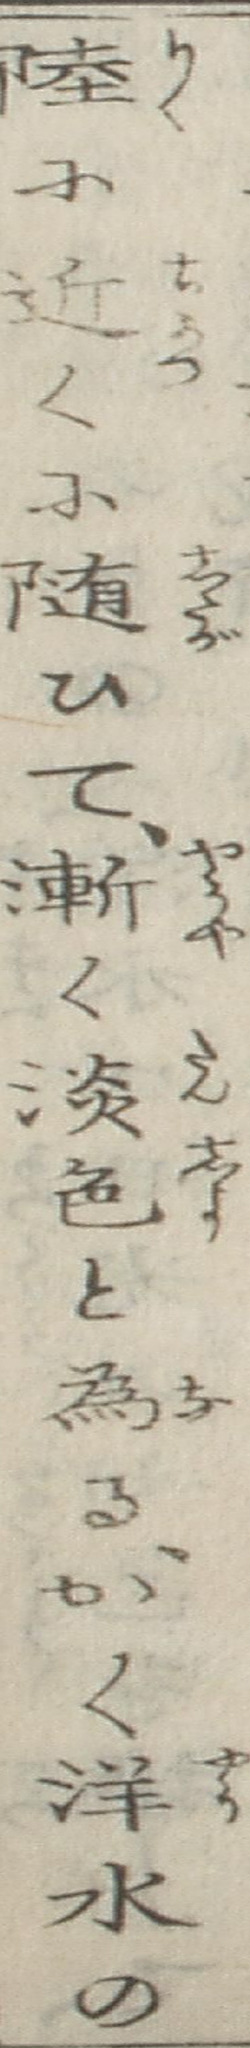陸に近くに随ひて、漸く淡色と為る、かく洋水の

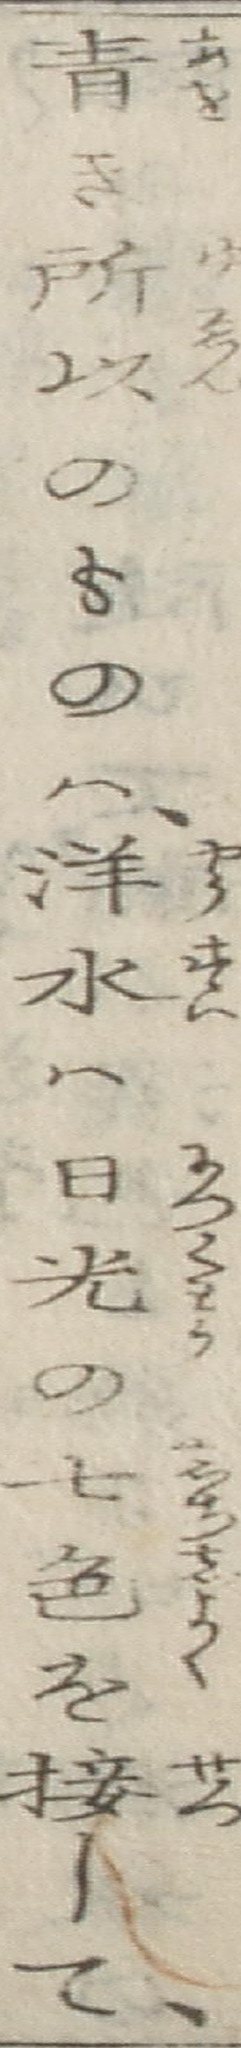青き所以のものは、洋水は日光の七色を接して、
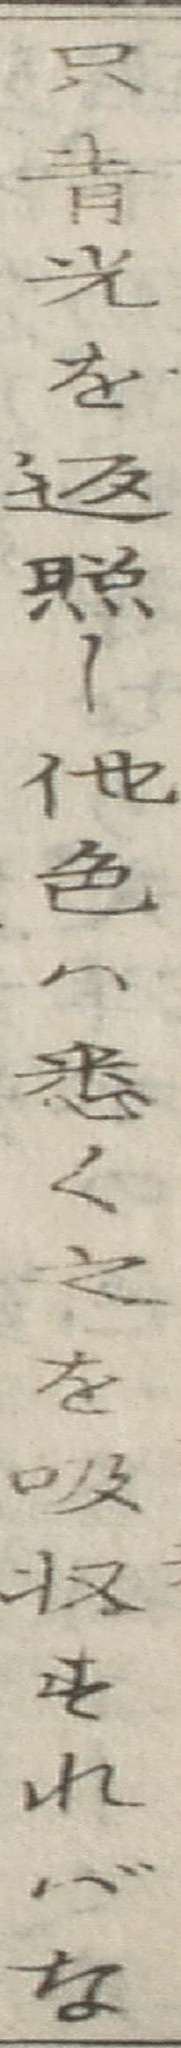只青光を返照し他色は悉く之を吸収すればな
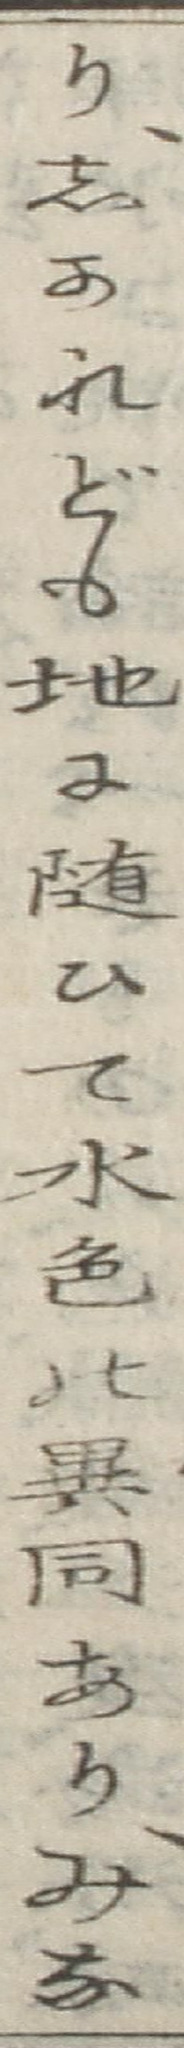り、しかれども地に随ひて水色の異同あり、みな
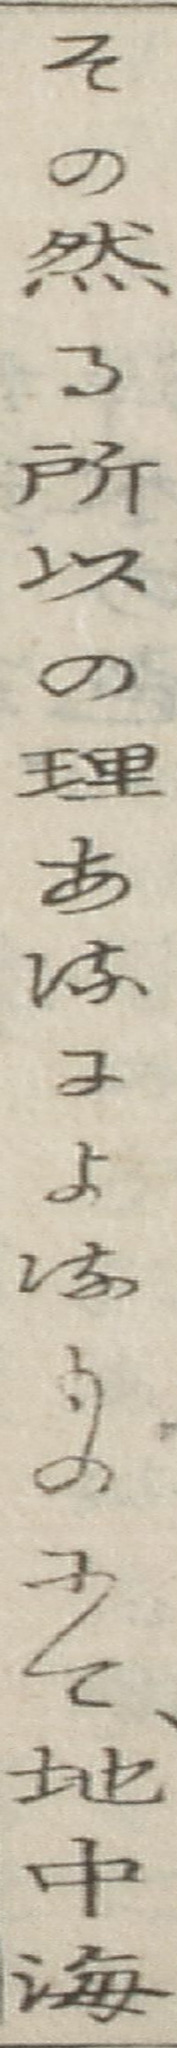その然る所以の理あるによるものにて、地中海
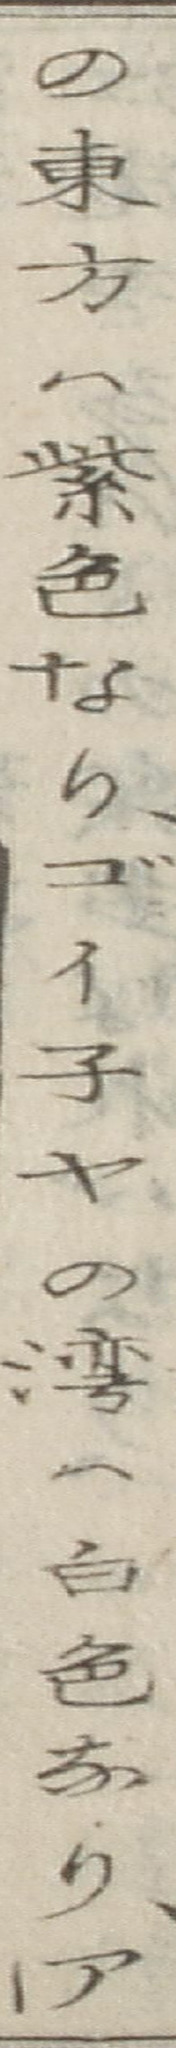の東方は紫色なり、ゴイネヤの湾は白色なり、ア
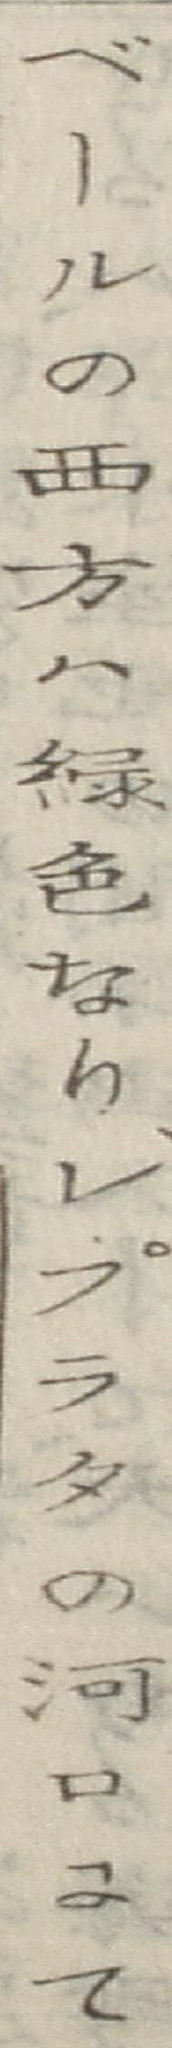ベールの西方は緑色なり、レプラタの河口にて
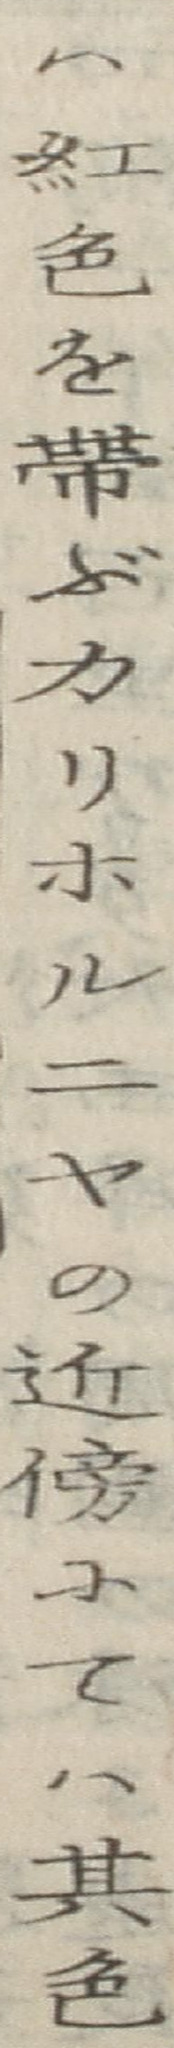は紅色を帯ぶ、カリホルニヤの近傍にては其色
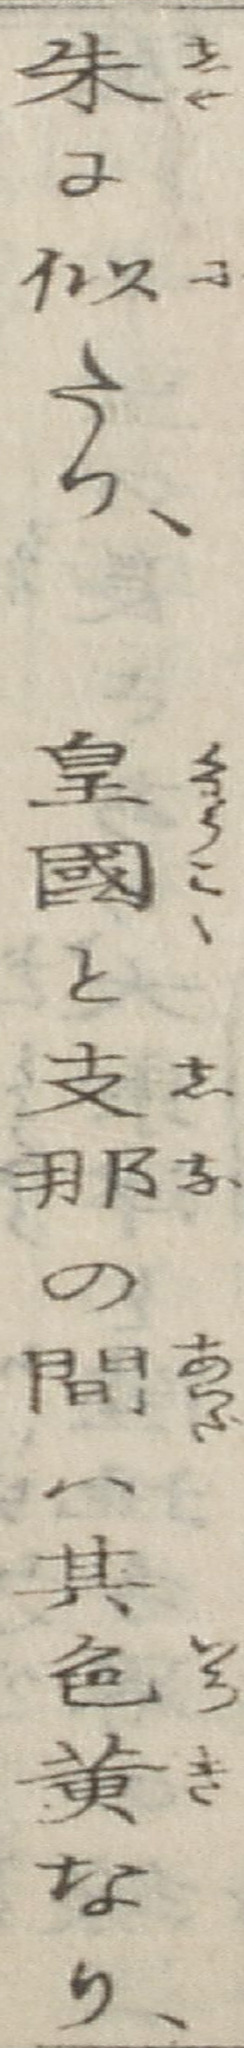朱に似たり、皇国と支那の間は其色黄なり、
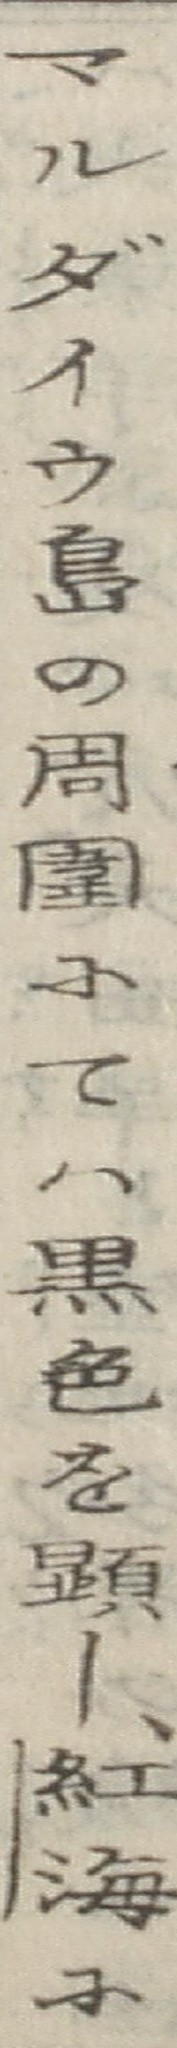マルダイウ島の周囲にては黒色を顕し、紅海に
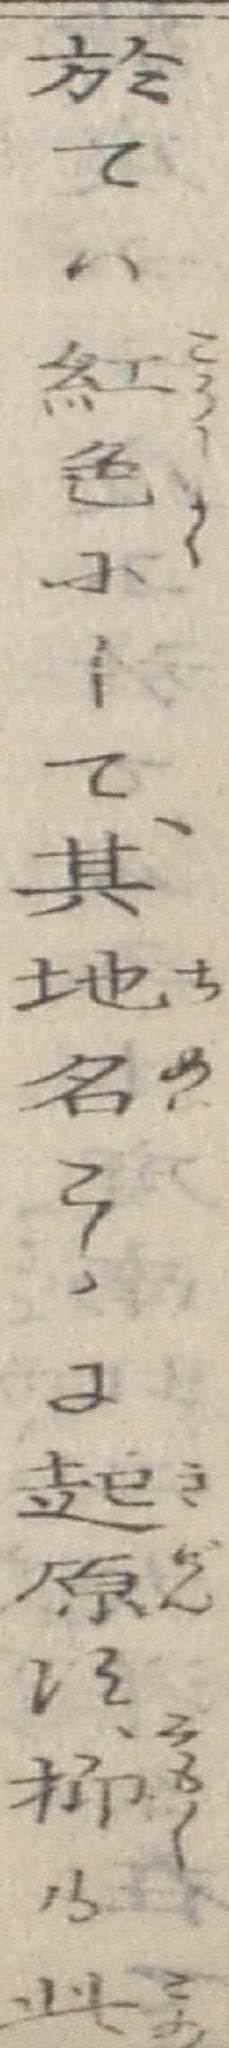於ては紅色にして、其地名こゝに起源す、抑の此
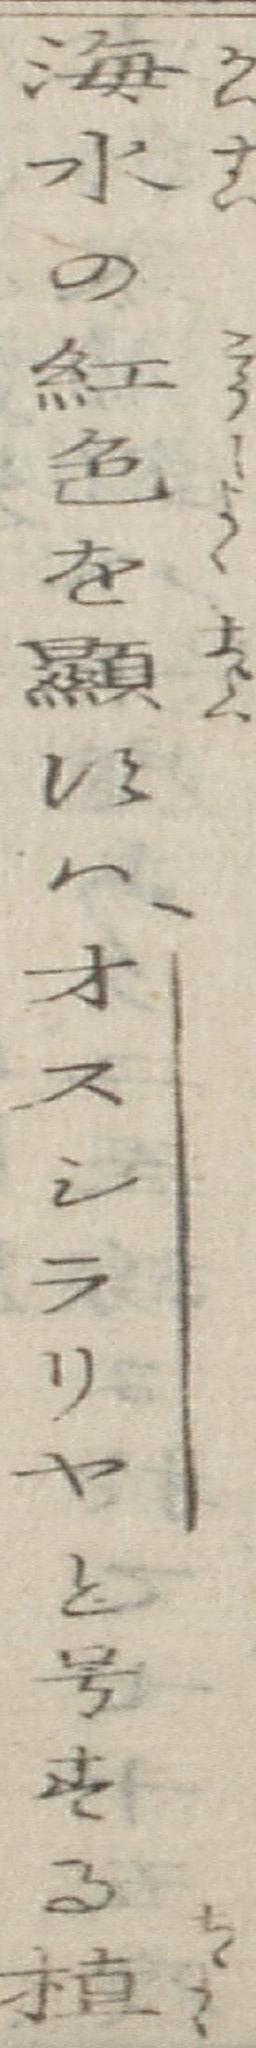海水の紅色を顕すは、オスシラリヤと号する植
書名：訓蒙　天然地理學　中
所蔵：東京大学地震研究所図書室 Earthquake Research Institute Library, The University of Tokyo, JAPAN
